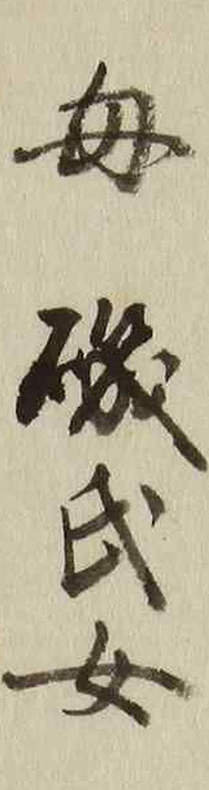母磯氏女
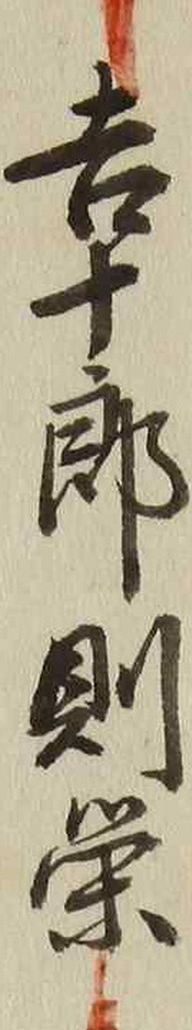吉十郎則栄
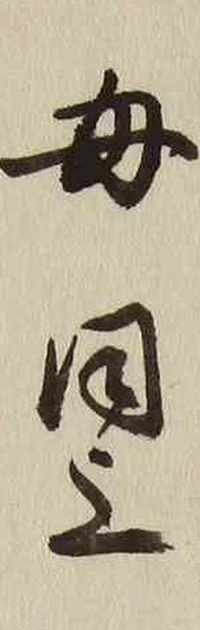母同上
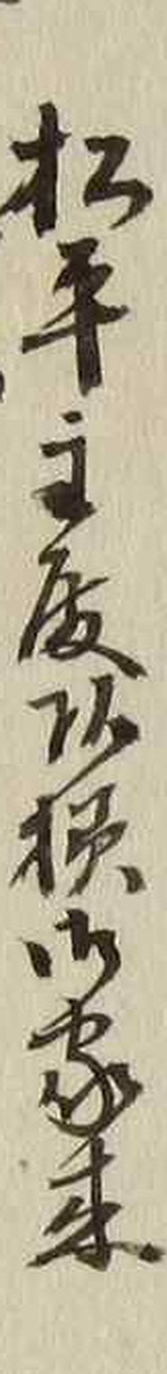松平主殿頭様御家来
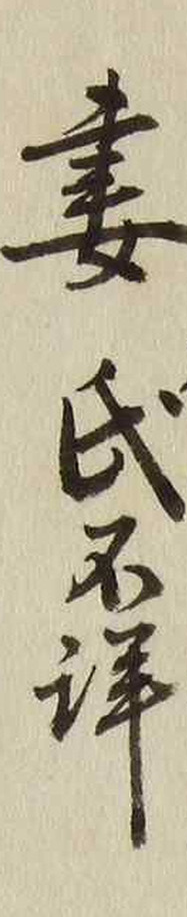妻氏不詳
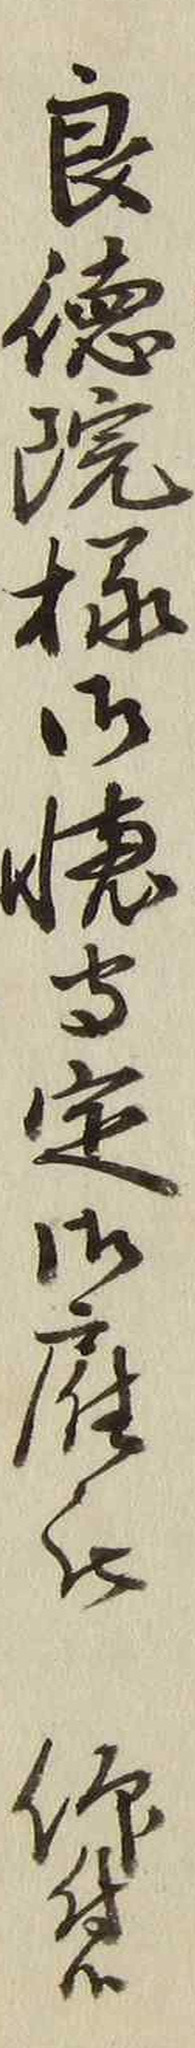良徳院様御懐守定御雇被仰付候
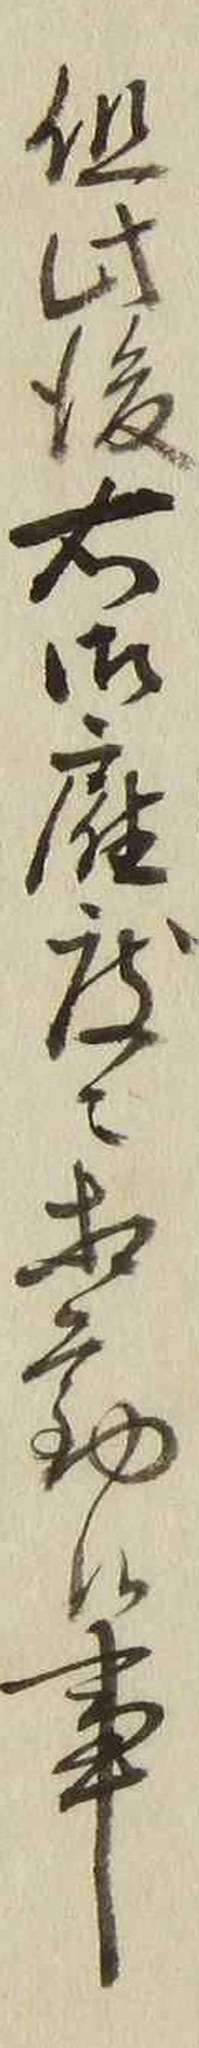但此後右御雇度々相勤候事

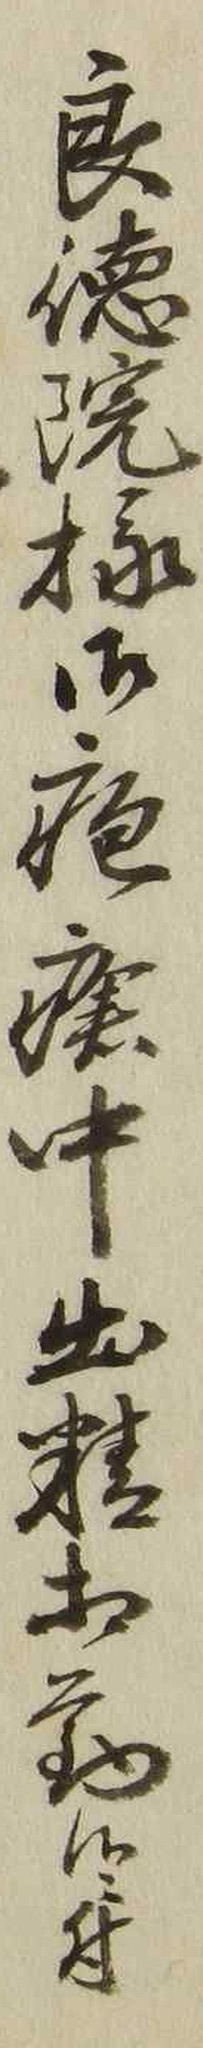良徳院様御疱瘡中出精相勤候ニ付
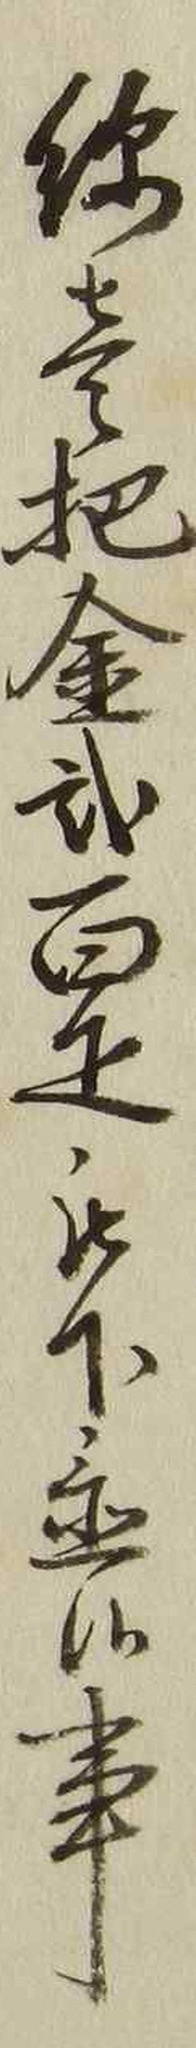綿壱把金弐百疋被下置候事
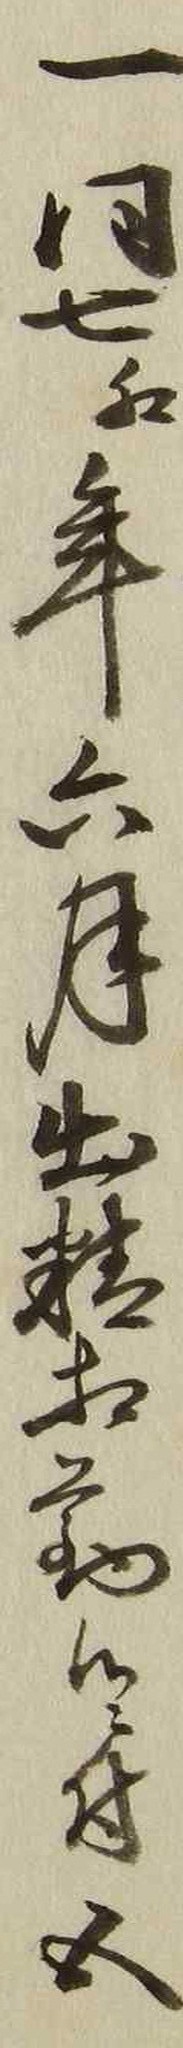一同七卯六月出精相勤候ニ付五
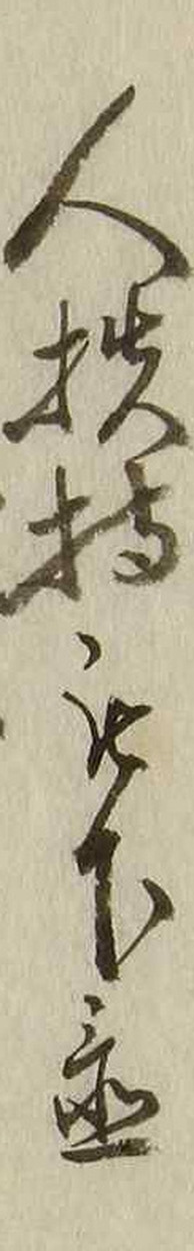人扶持被下置
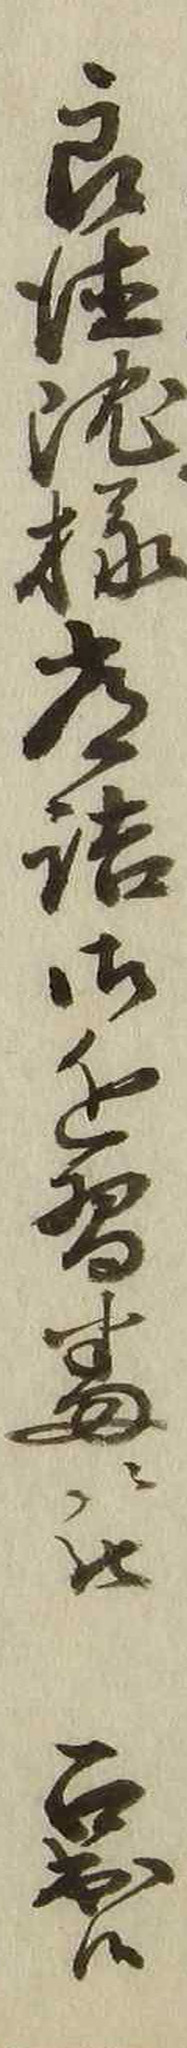良徳院様常詰御近習番ニ被召出候
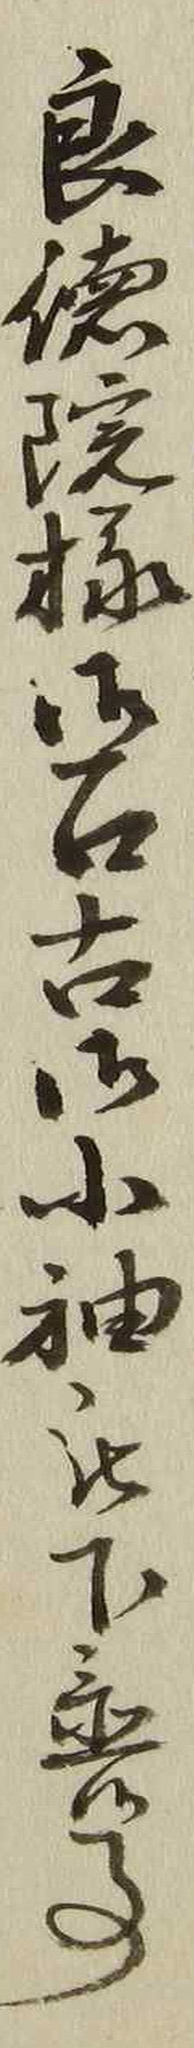良徳院様御召古御小袖被下置候事
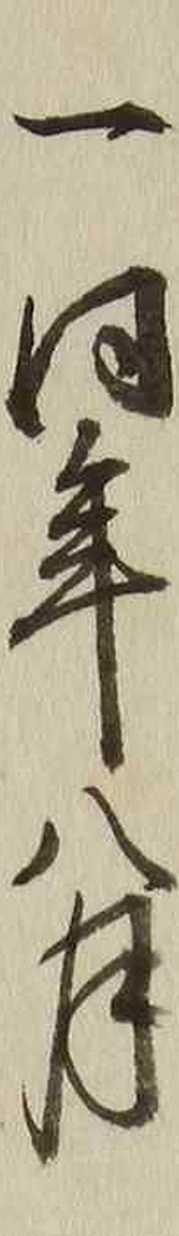一同年八月
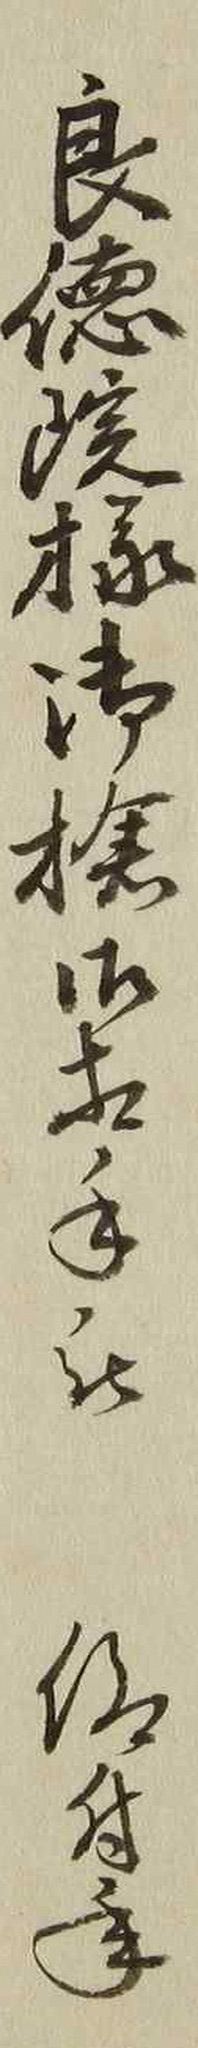良徳院様御槍御相手被仰付年
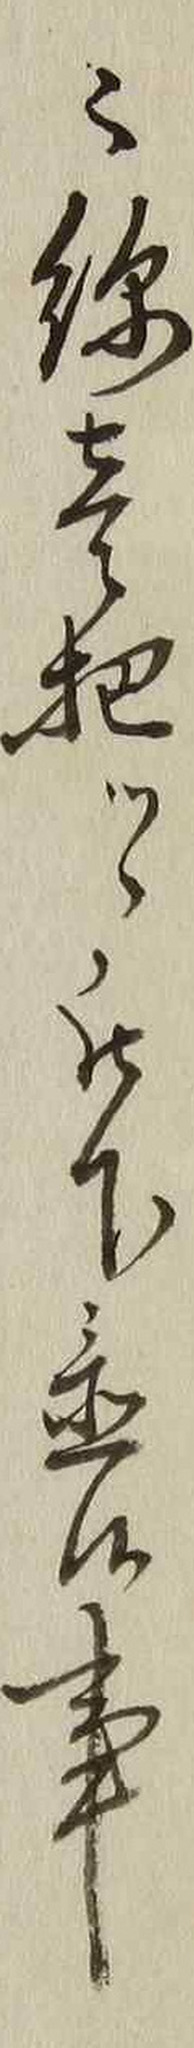々綿壱把ツヽ被下置候事
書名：諸士系譜　巻之31　い之部31
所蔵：会津若松市立会津図書館
